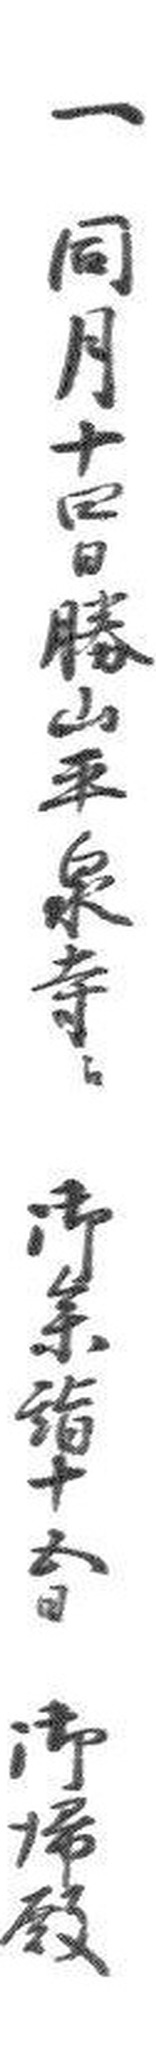一同月十四日勝山平泉寺江御参詣十五日御帰殿
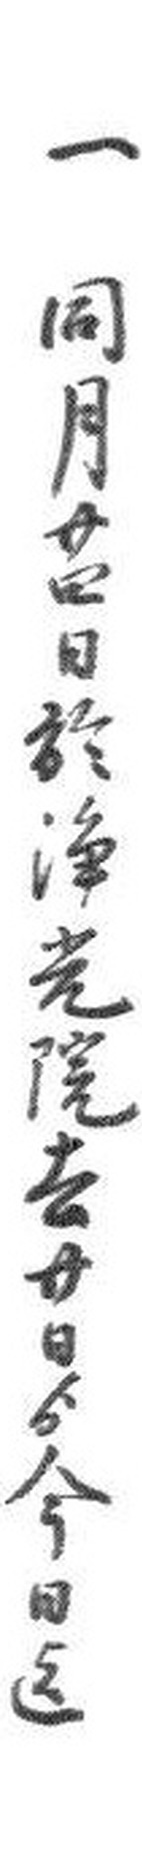一同月廿四日於浄光院去廿日ゟ今日迄
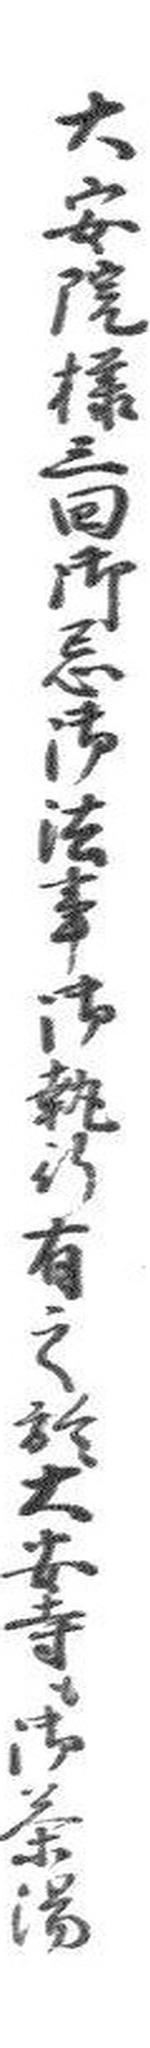大安院様三回御忌御法事御執行有之於大安寺も御茶湯
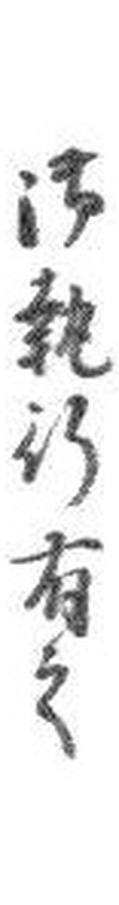御執行有之
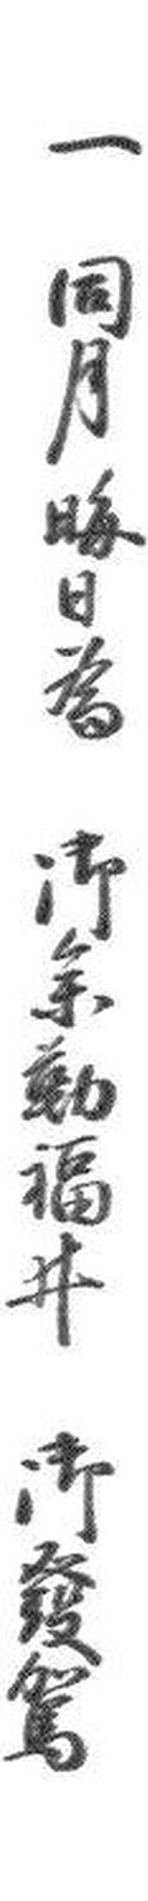一同月晦日為御参勤福井御発駕
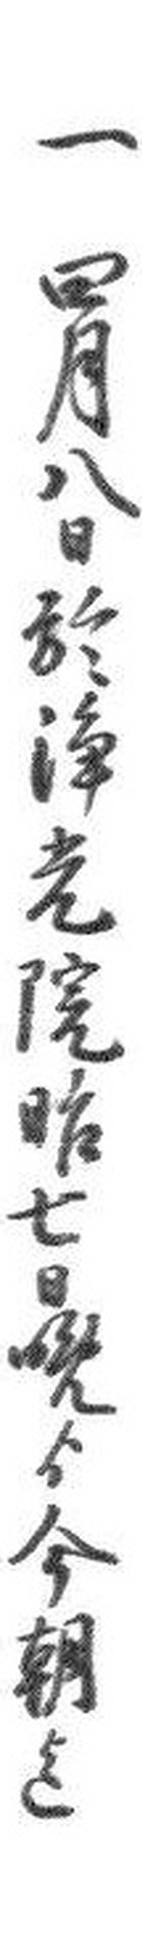一四月八日於浄光院昨七日晩ゟ今朝迄
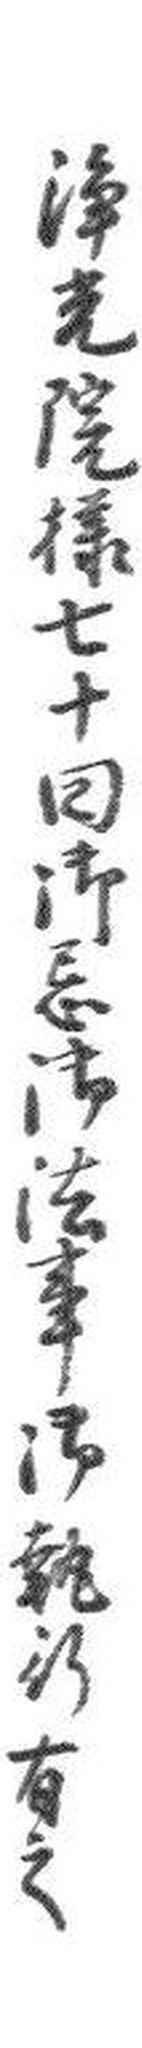浄光院様七十回御御忌御法事御執行有之
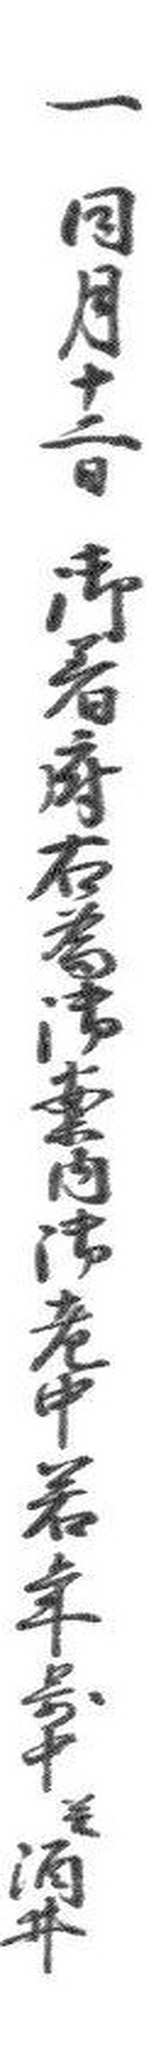一同月十二日御着府右御案内御老中若年寄中并酒井

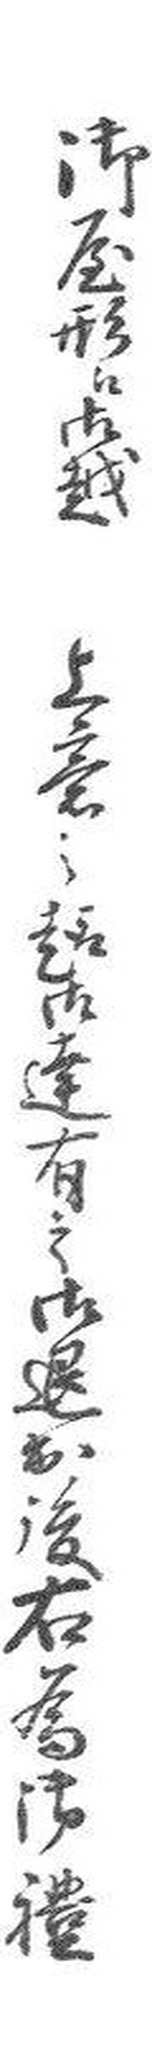御屋形江御越上意之趣御達有之御退出後右為御礼
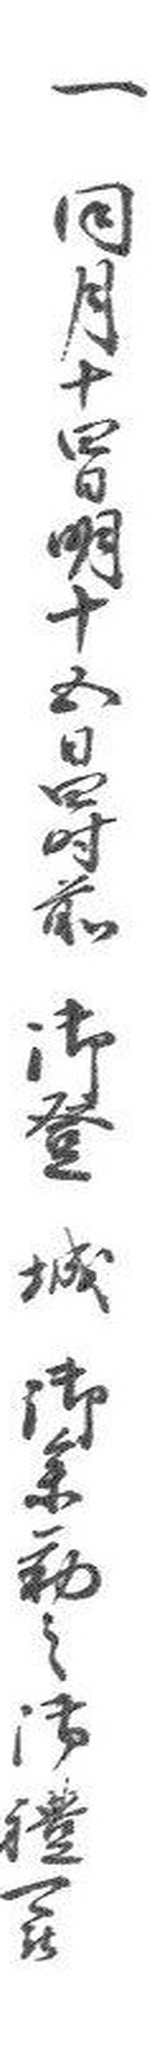一一同月十四日明十五日四時前御登城御参勤之御礼可被
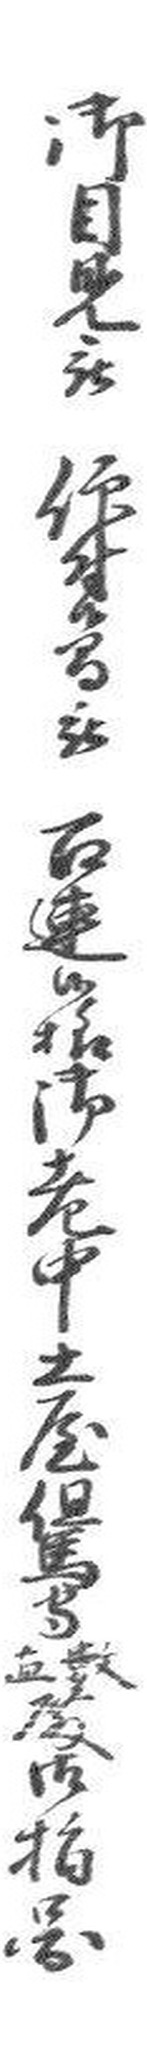御目見被仰付候間被召連候様御老中土屋但馬守数直殿御指図
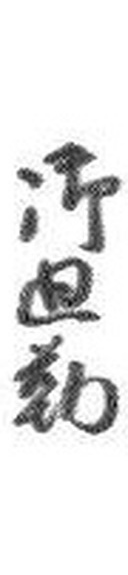御廻勤
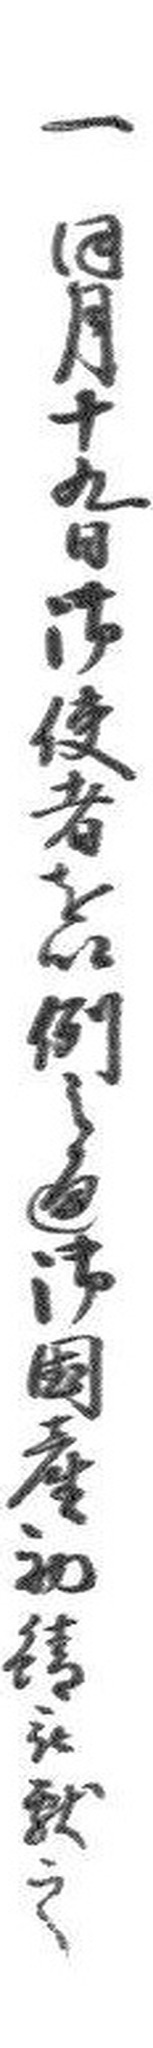一同月十九日御使者を以例之通御国産初鯖被献之
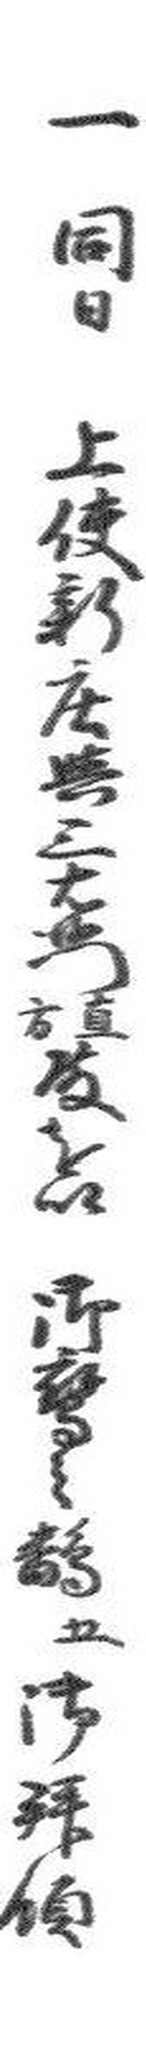一同日上使新庄与三右衛門直方を以御鷹之鷭五御拝領

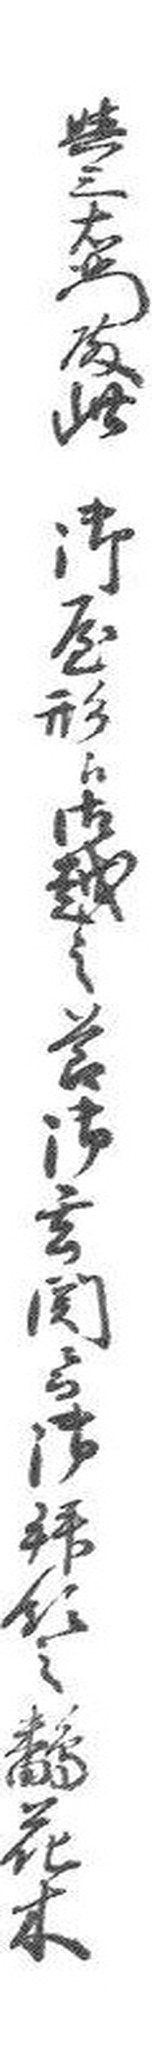與三右ヱ門殿此御屋形江御越之節御玄関ニ而御拝領之鷭花木
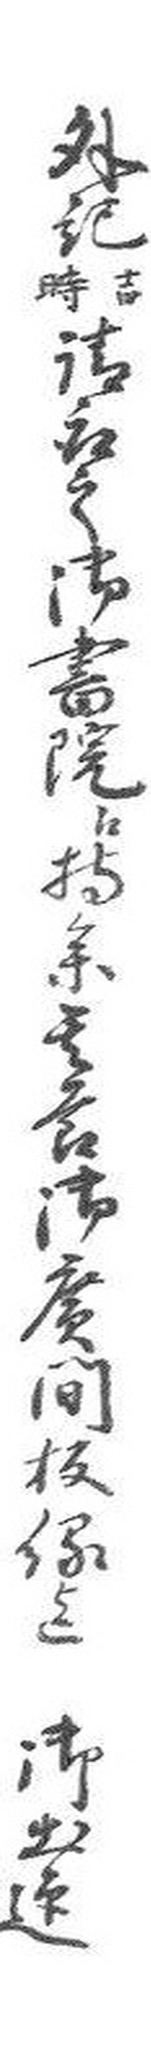外記吉時請取之御書院江持参其節御広間板縁迄御出迎
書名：家譜 十一 昌親公 従延宝二年到延宝四年八月
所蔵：福井県文書館 Fukui Prefectural Archives
